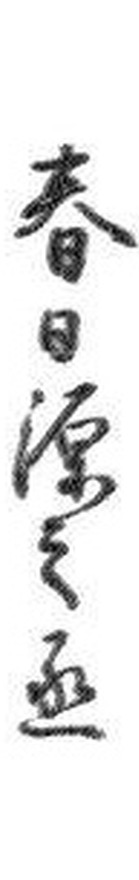春日源之丞
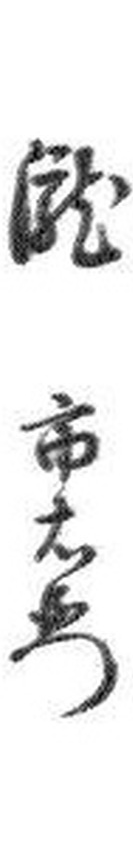瀧市右衛門
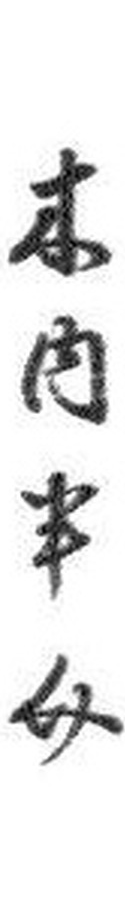木内半介
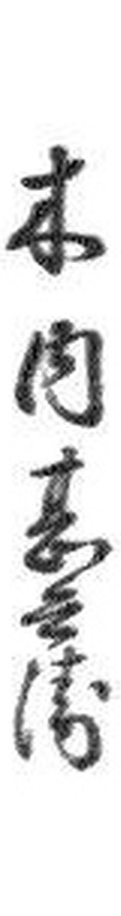木内甚兵衛
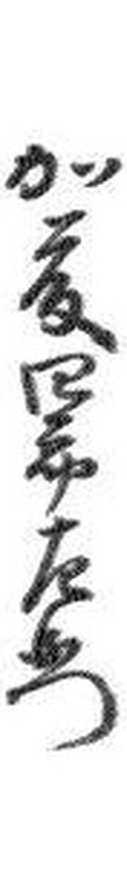加藤四郎左衛門
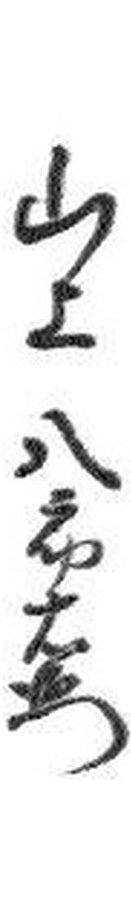山上八郎右衛門
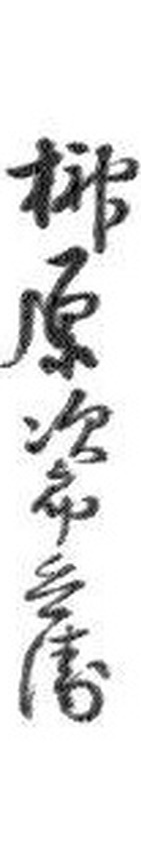柳原次郎兵衛
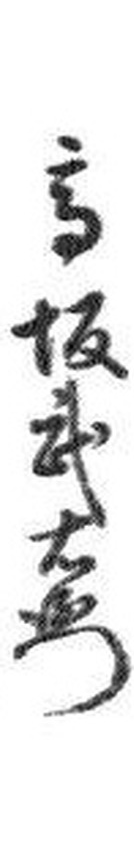高坂武右衛門

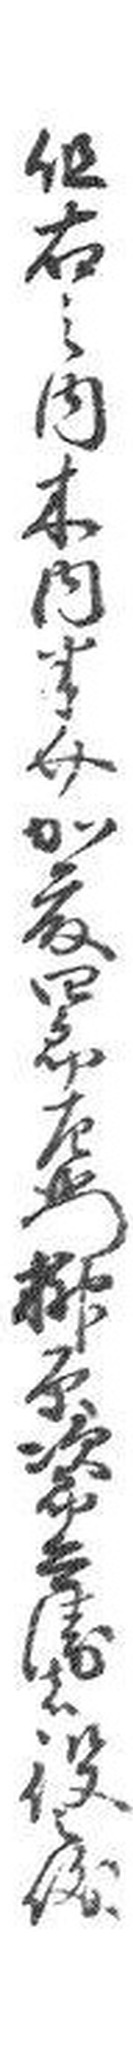但右之内木内半介加藤四郎左衛門榊原次郎兵衛者役之儀
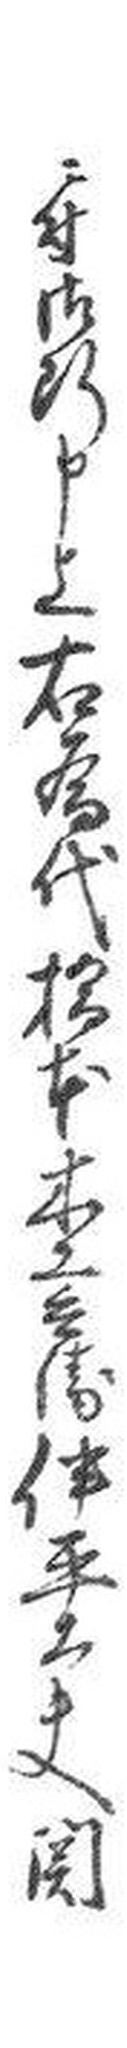ニ付御断申上右為代橋本杢兵衛伴平大夫関
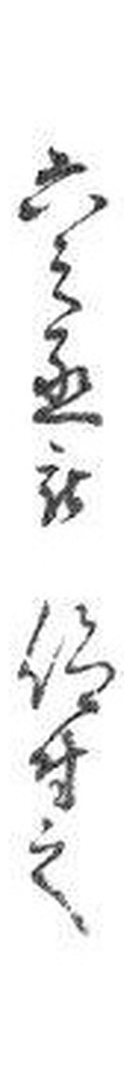六之丞被仰付之
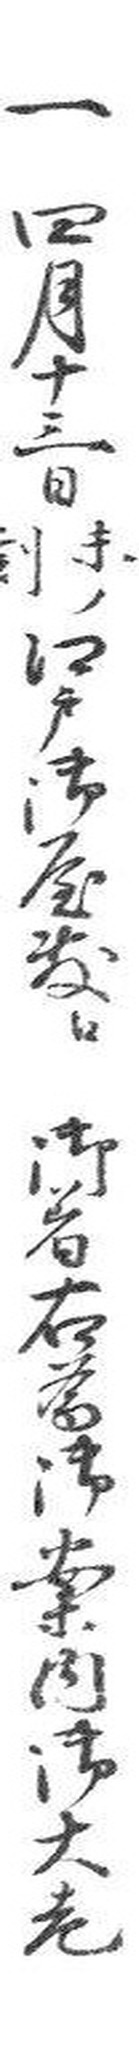一四月十三日未ノ刻江戸御屋敷江御着右為御案内御大老
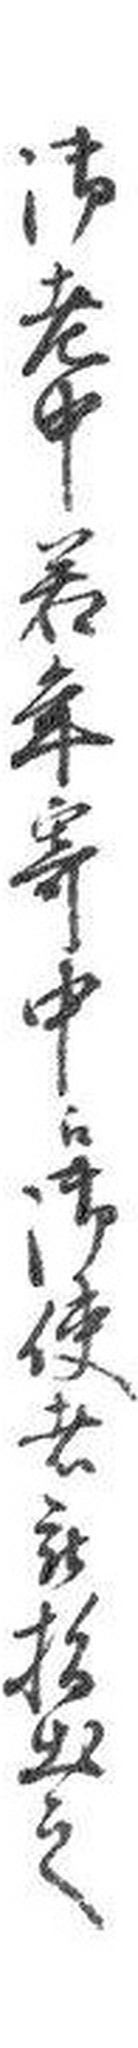御老中若年寄中江御使者被指出之
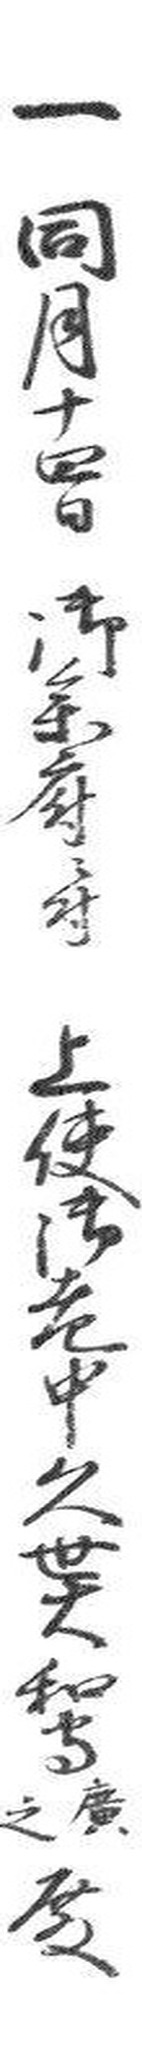一同月十四日御参府ニ付上使御老中久世大和守廣之殿
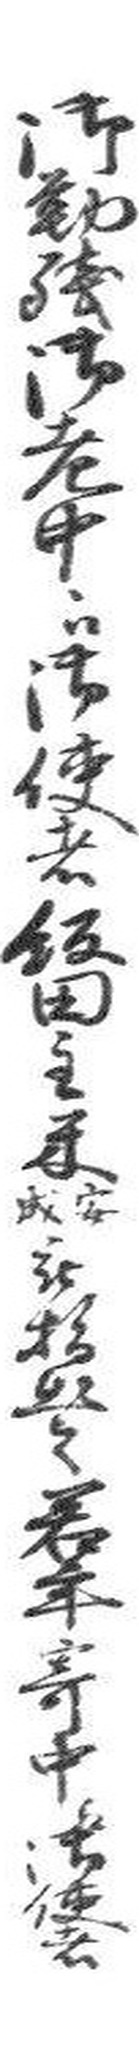御勤残御老中江御使者飯田主米安成被指出之若年寄中江御使者
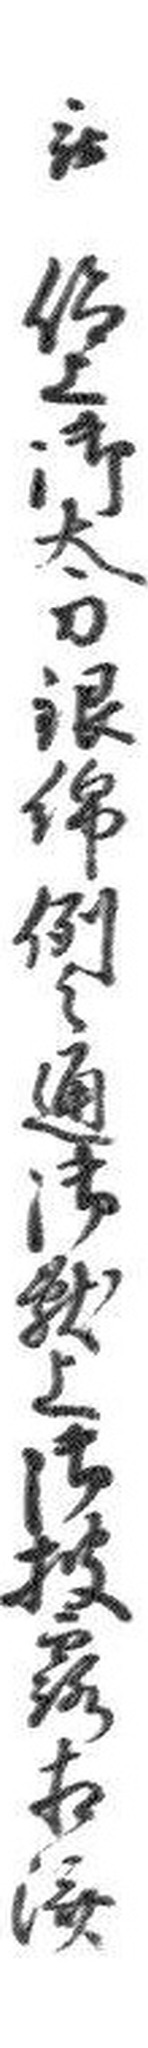被仰上御太刀銀綿例之通御献上御披露相済
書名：家譜 八 光通公 従寛文十年到同十二年
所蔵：福井県文書館 Fukui Prefectural Archives
